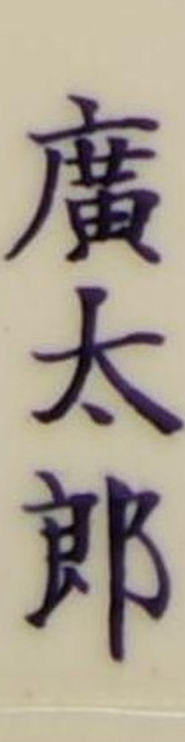廣太郎

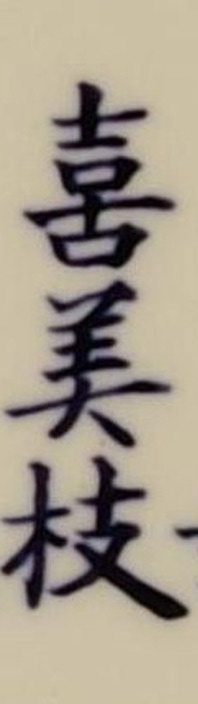喜美枝
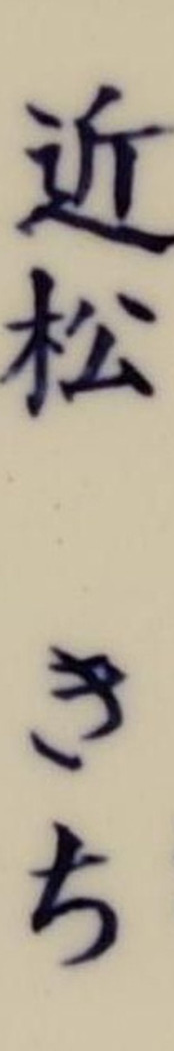近松きち
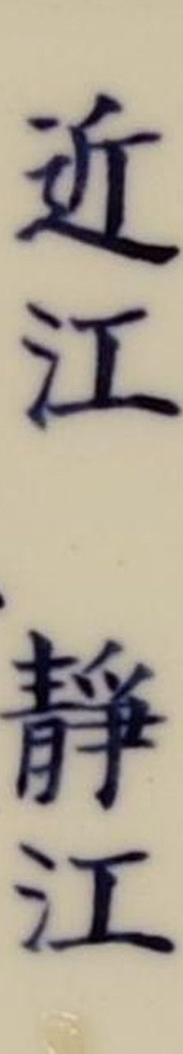近江静江
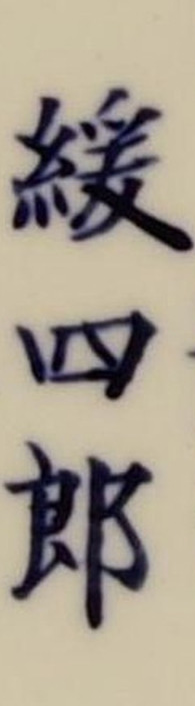緩四郎
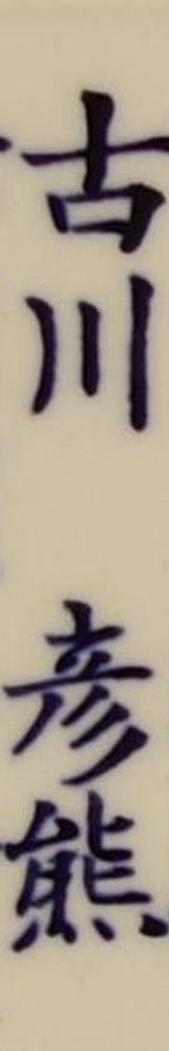古川彦熊
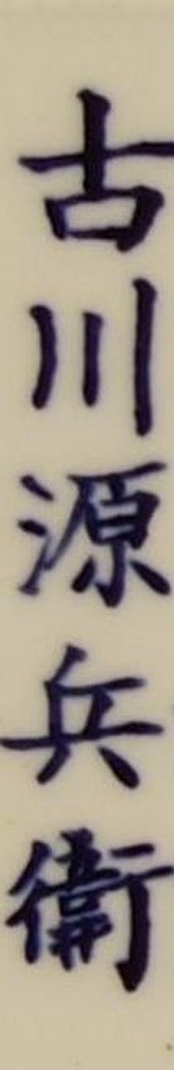古川源兵衛
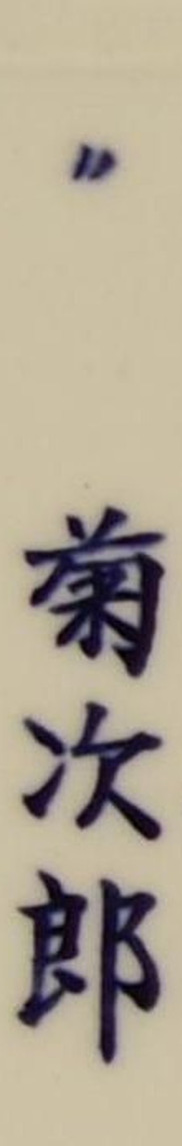菊次郎
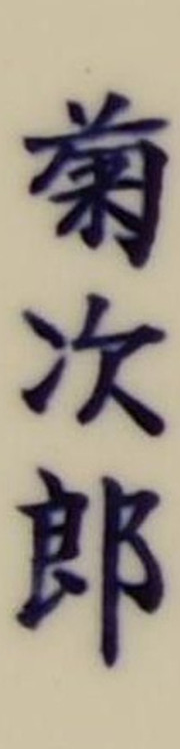菊次郎
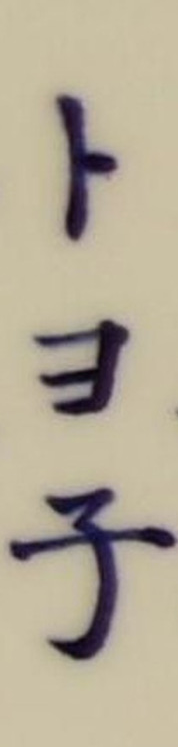トヨ子
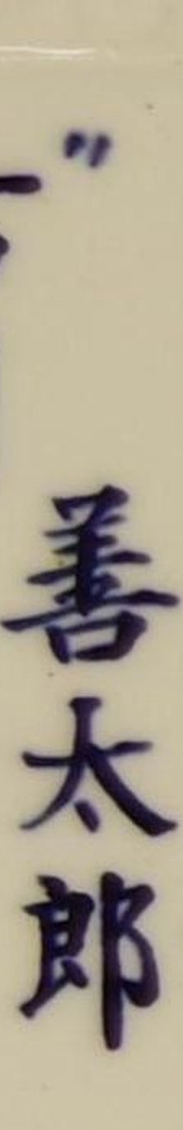善太郎
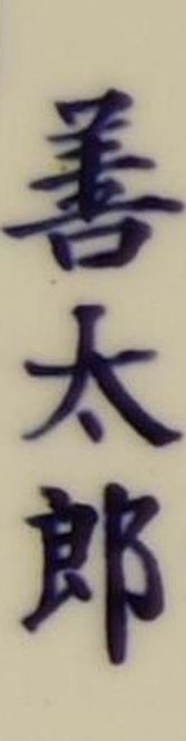善太郎
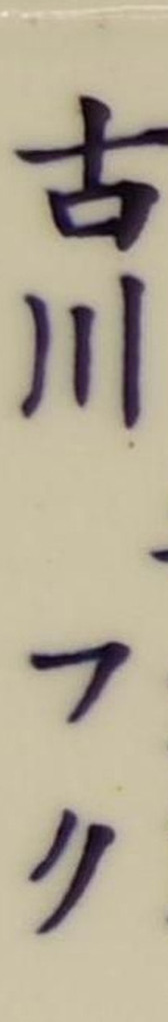古川フク

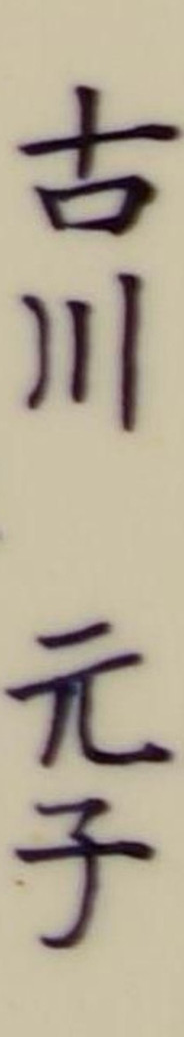古川元子
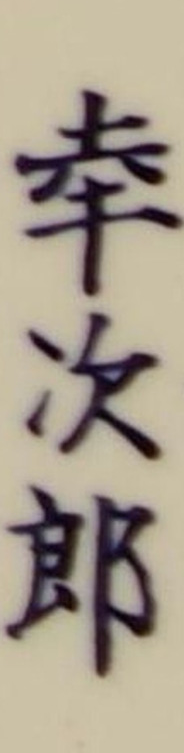幸次郎
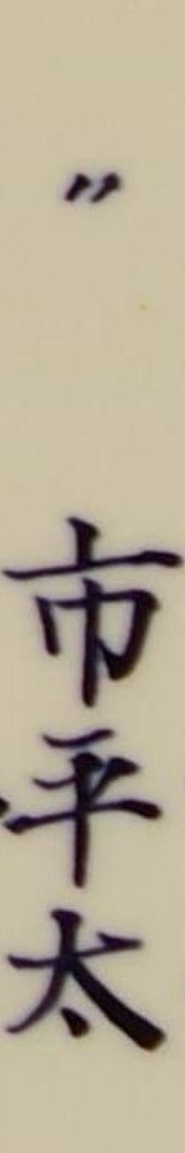市平太
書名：E~L
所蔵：高野山金剛峯寺
